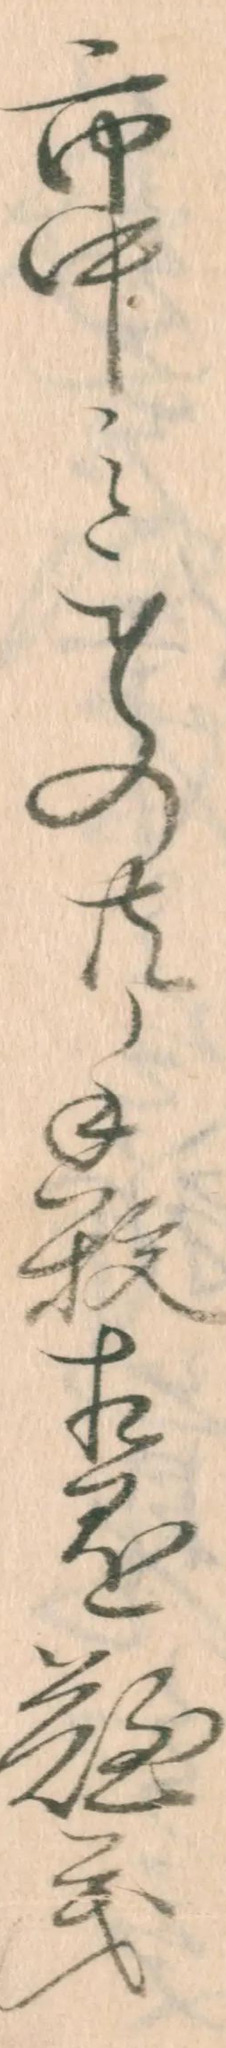市中之もの共手数相懸難儀
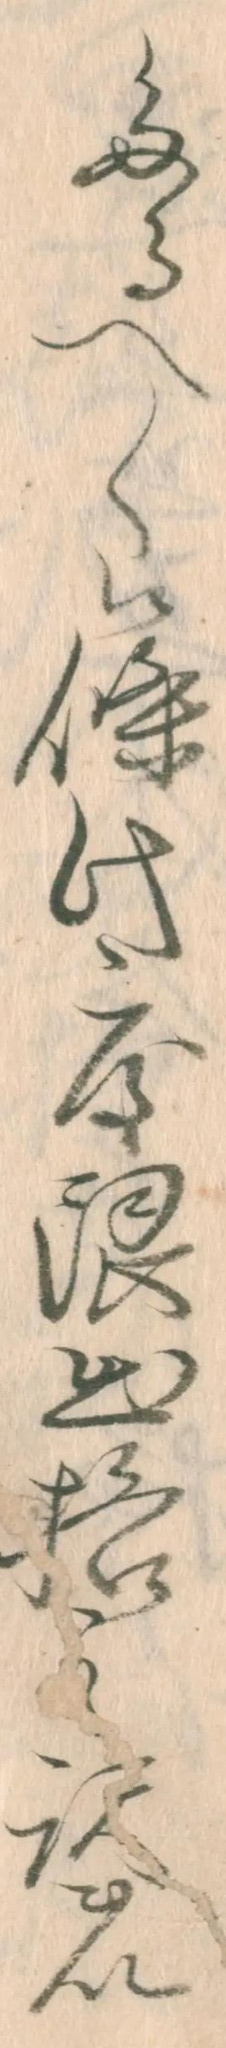たるへく候条此度限出格之訳ヲ以
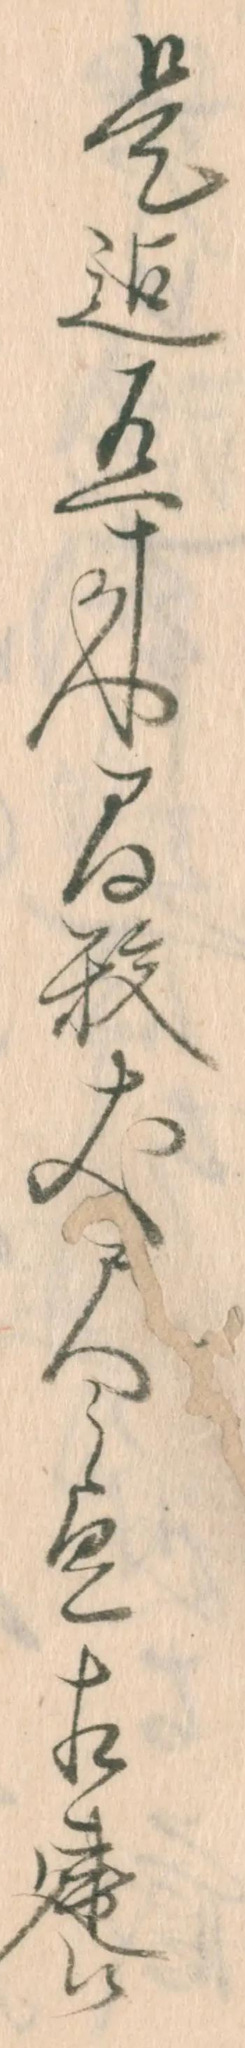是迄有来間数丈尺之通相建候
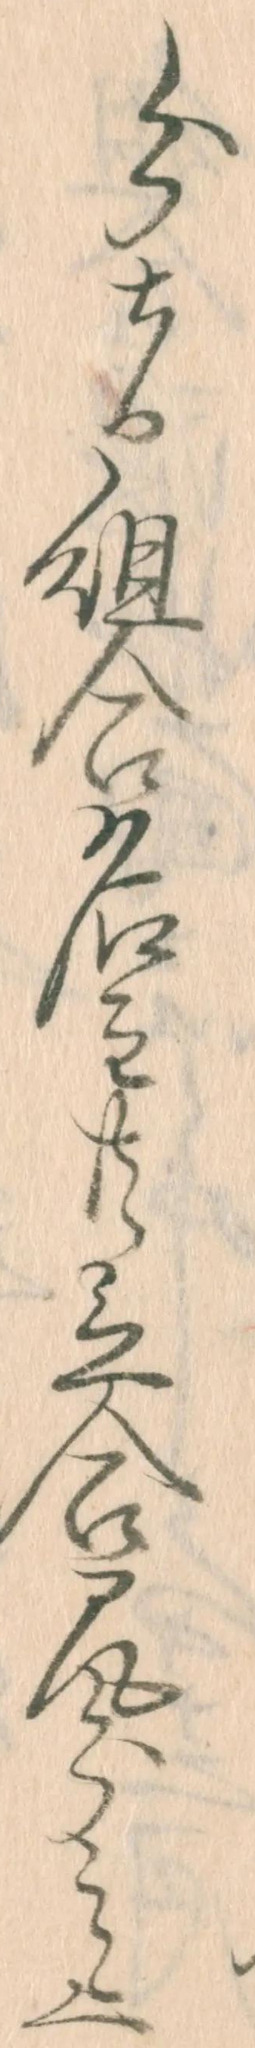分は組合名主共立合見分之上
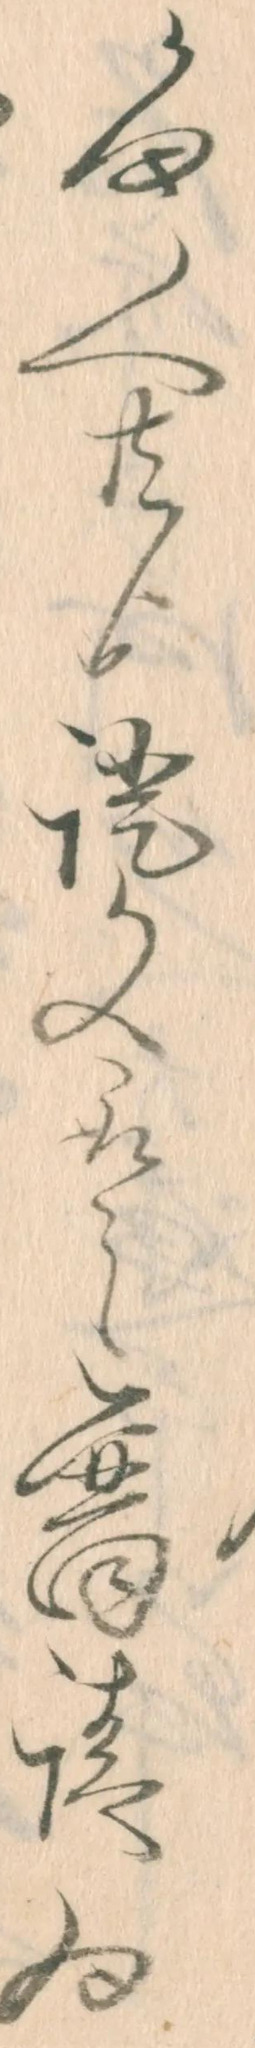当人共ゟ証文取之普請為
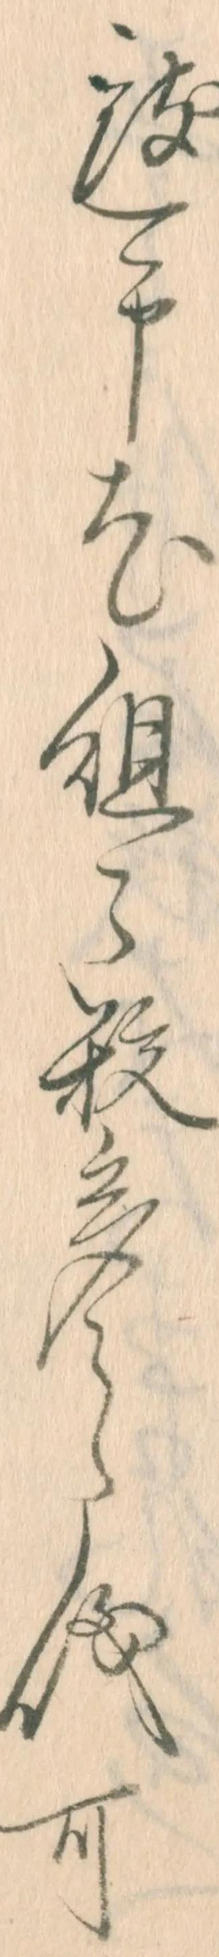致可申尤組々数多之儀可

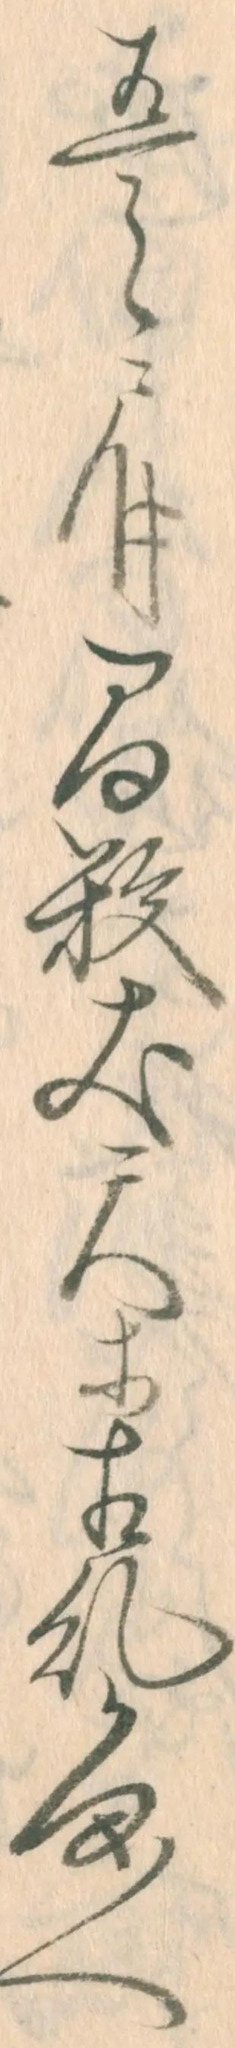有之ニ付間数丈尺等相糺当人
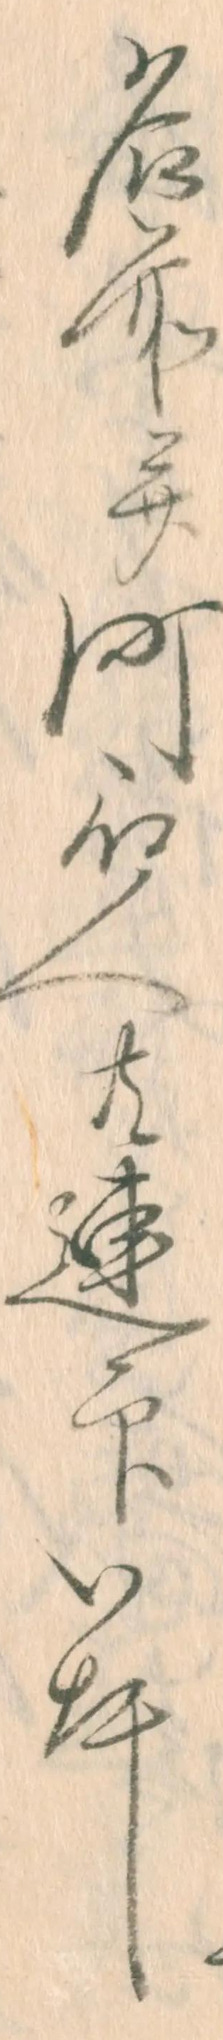名前幷町役人共連印いたし
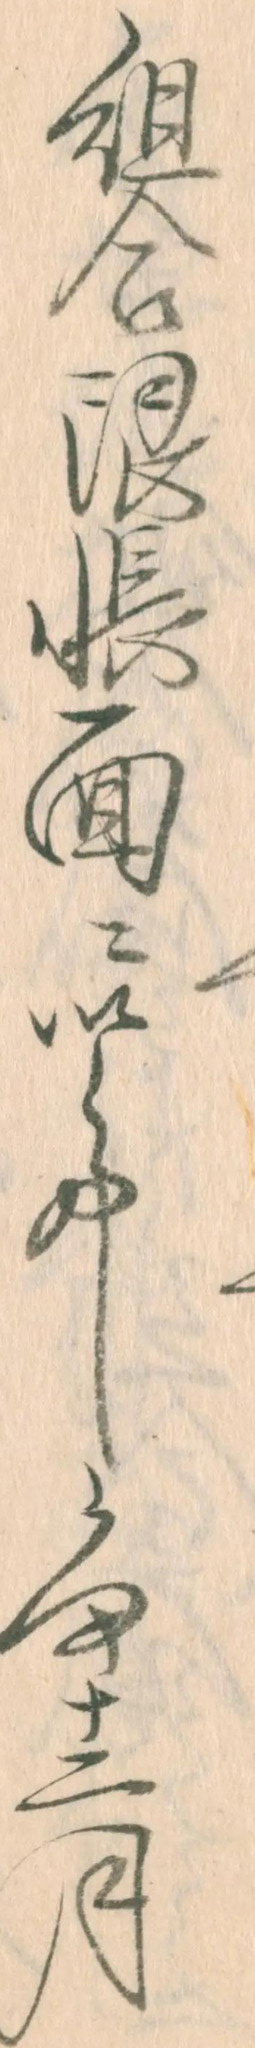組合限帳面ニいたし当十二月
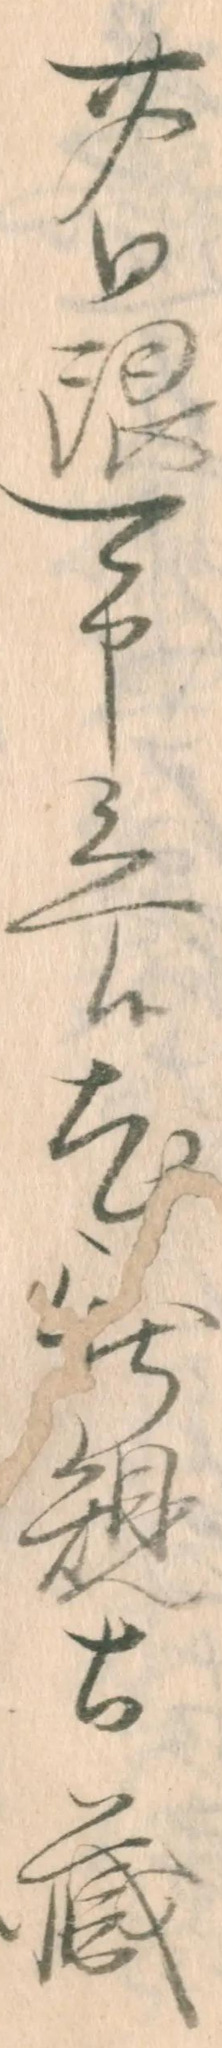廿日限可申立候尤新規土蔵
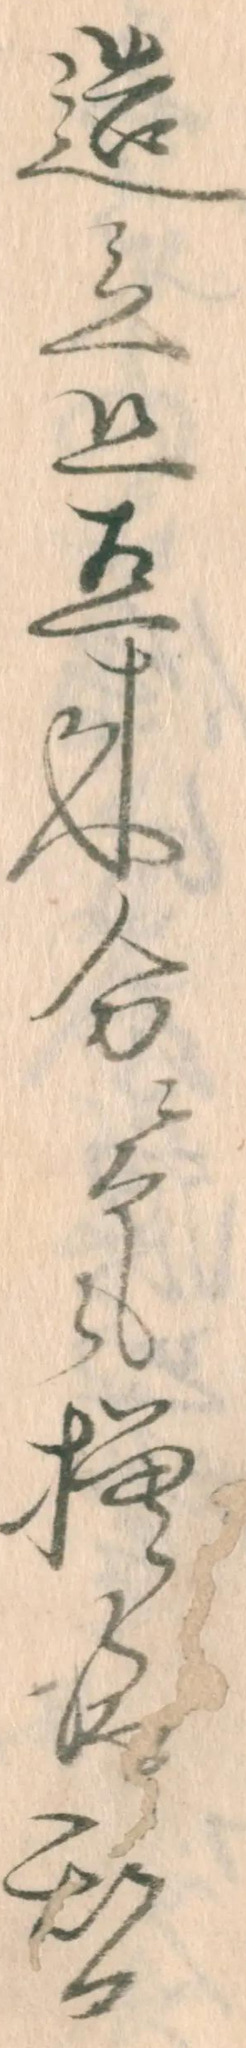造立且有来分ニ而も模様替
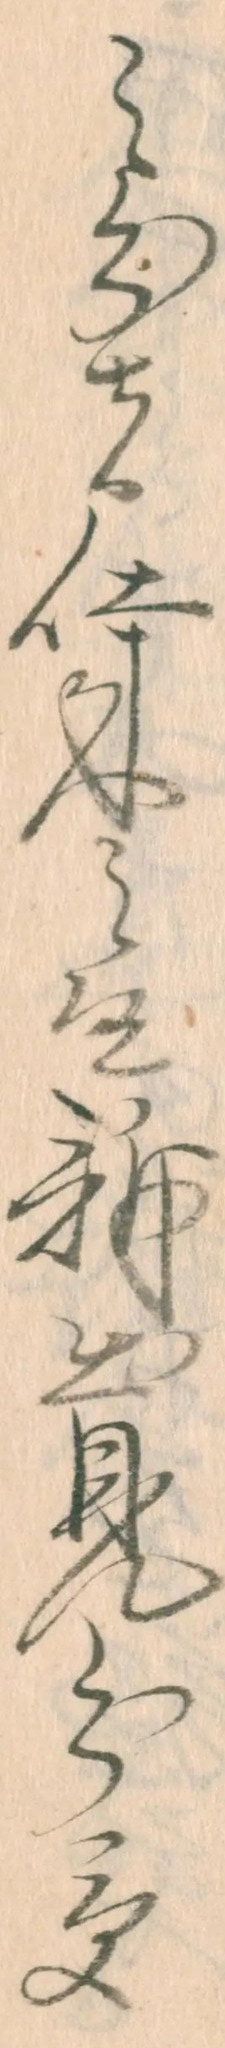之分は仕来之通訴出見分受
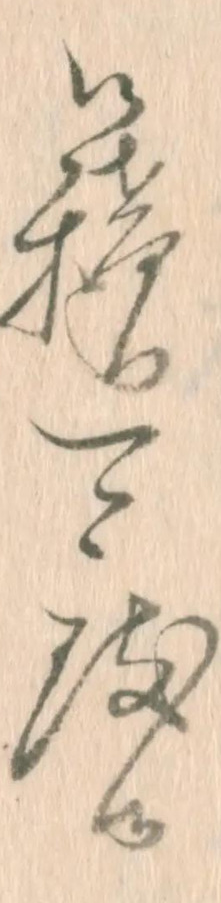候積可致候
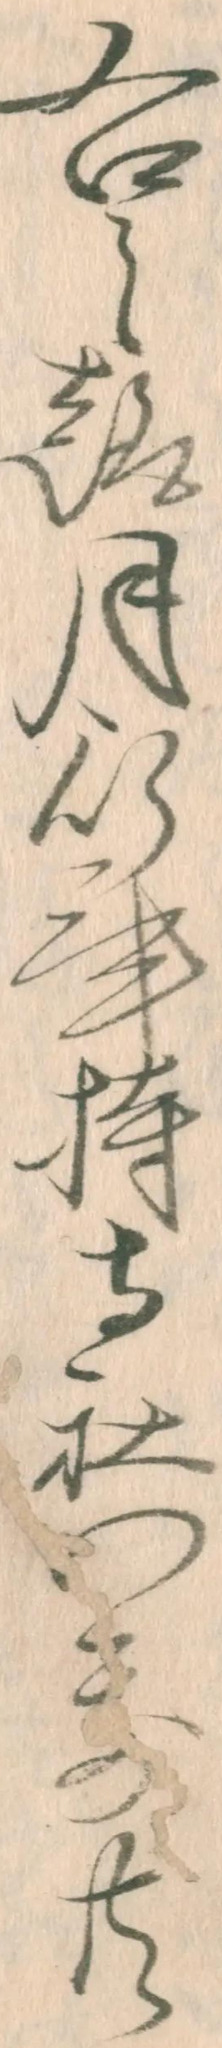右之趣月行事持寺社門前共
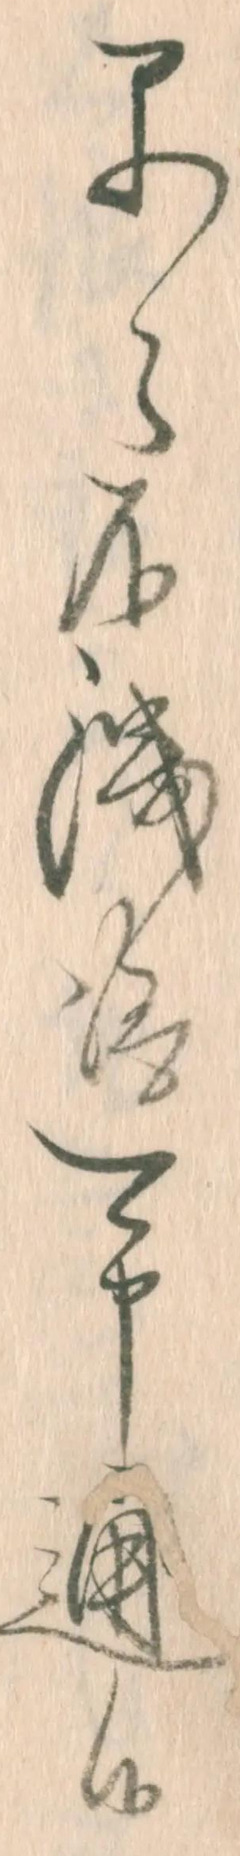早々不洩様可申通候

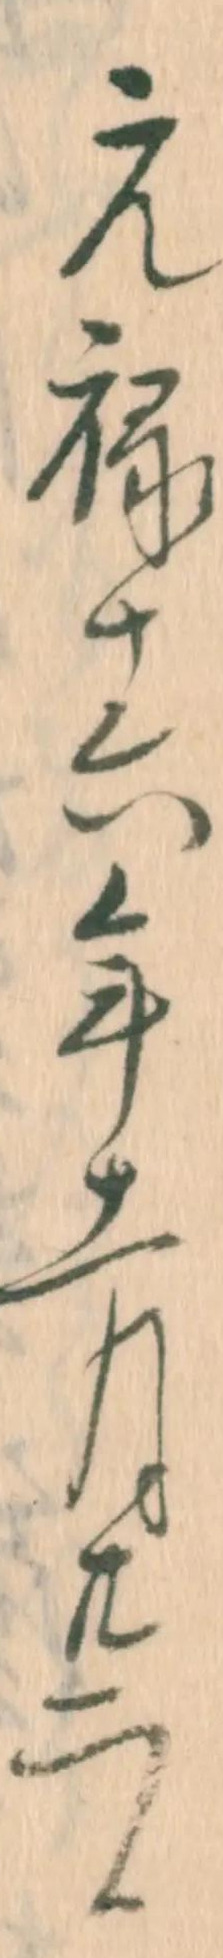元禄十六年十一月廿二日
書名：地震災書留 2巻. [1] 内表紙に「地震災書留　安政二卯年　但本所深川御用屋敷地代免除調」とあり
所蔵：国立国会図書館 National Diet Library, JAPAN
